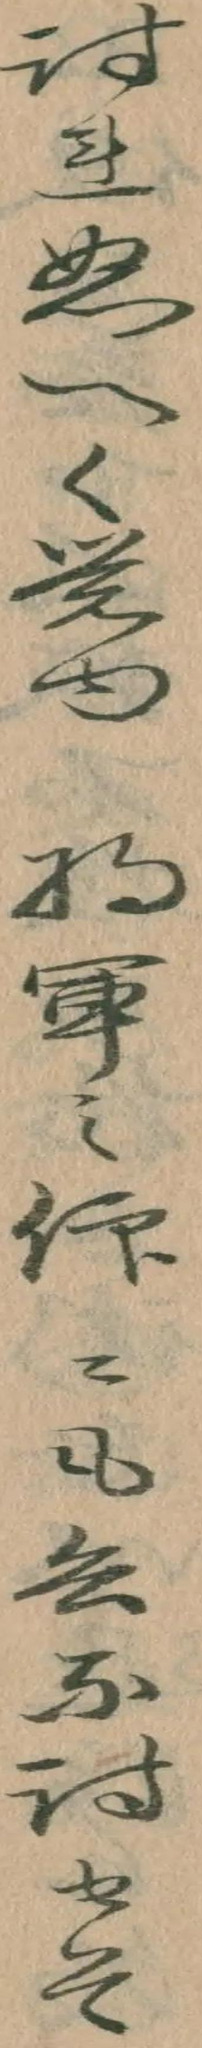討連怒へく覚ゆ将軍之仰にも兵ふ討せそ
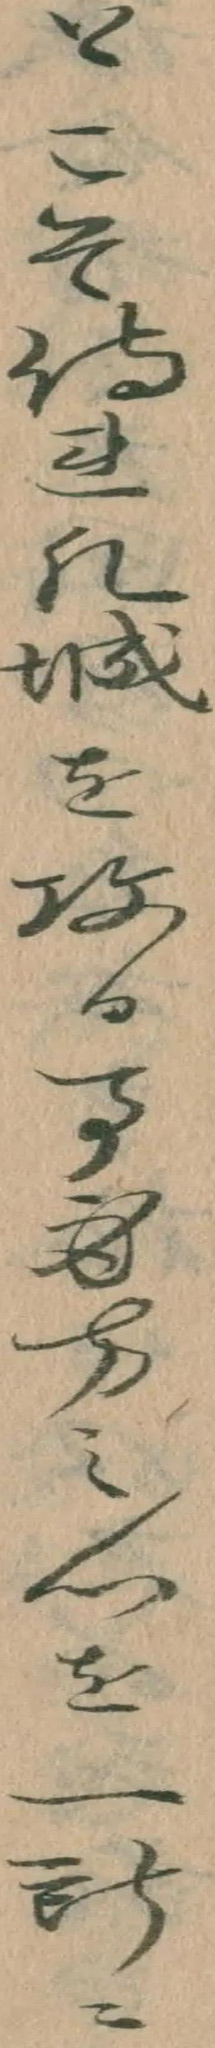とこそ侍連凡城を攻る事身方之心を一新に
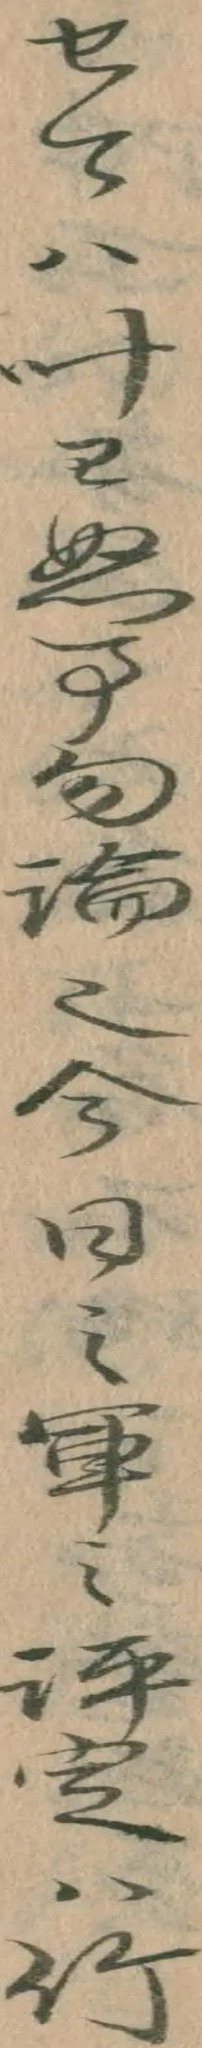せては叶已怒事勿論也今日之軍之評定は竹
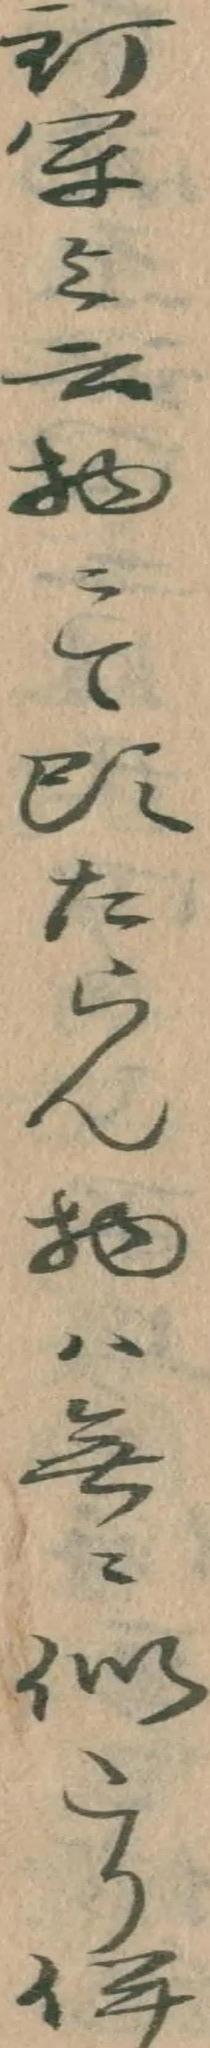釘軍与云物にて頭たらん物は無に似たり伊
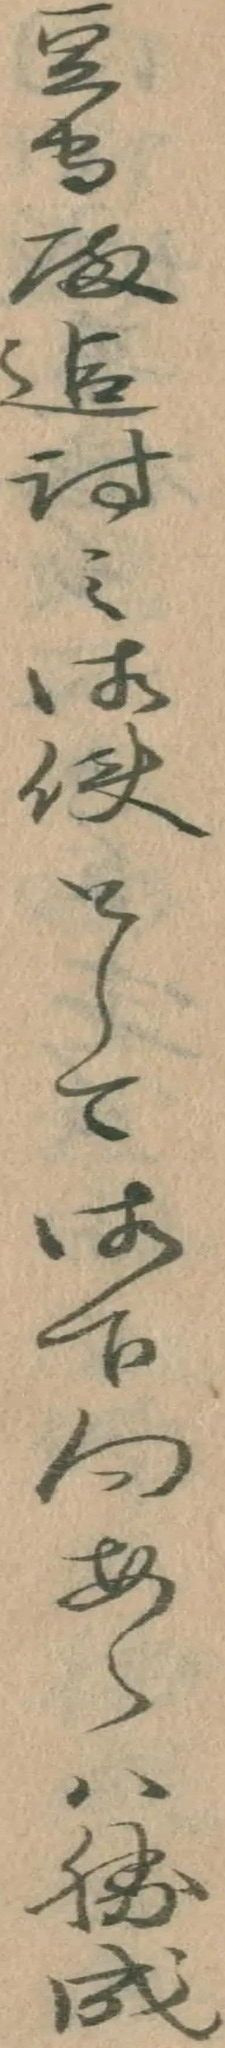豆守殿迄討之御使として御下向あらは勝成
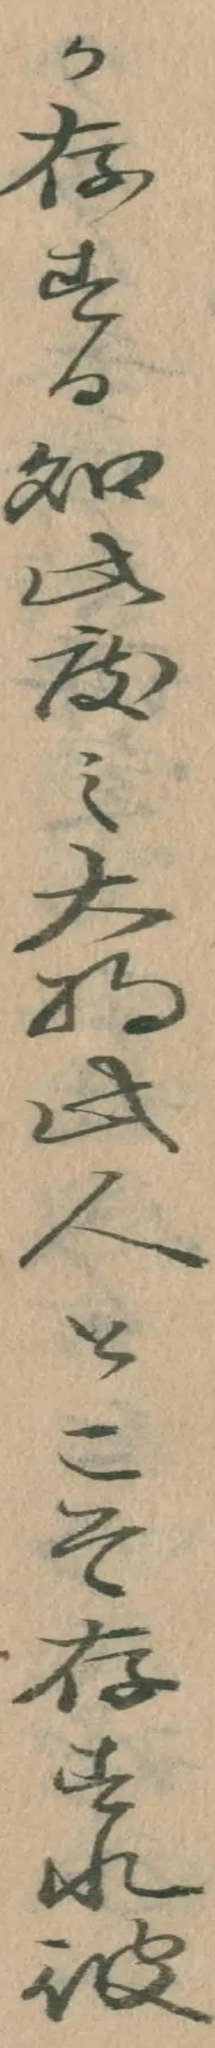か存春る処此度之大将此人とこそ存春れ彼
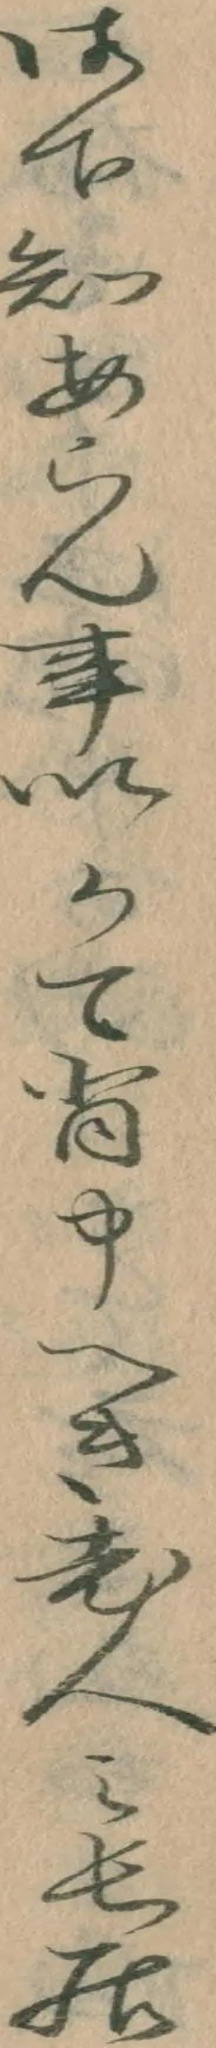御下知あらん事以かて背申へき老人之長居
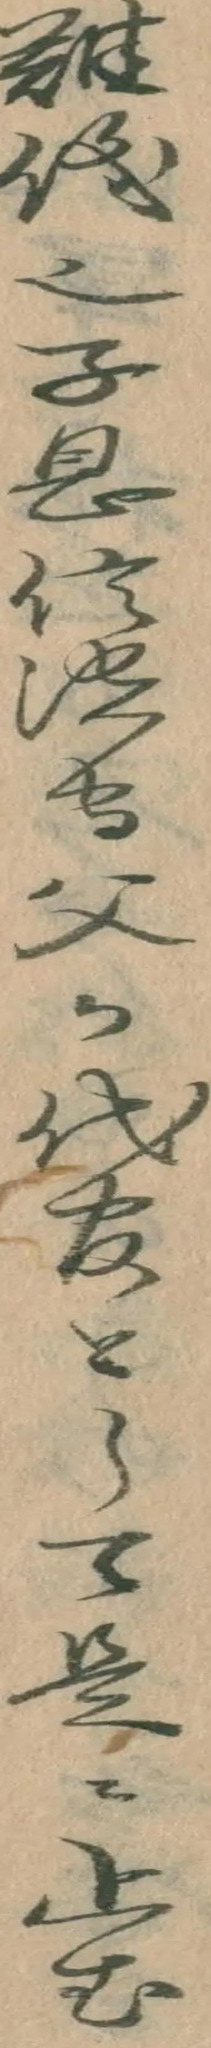難儀也子息信濃守父か代官として是に止む
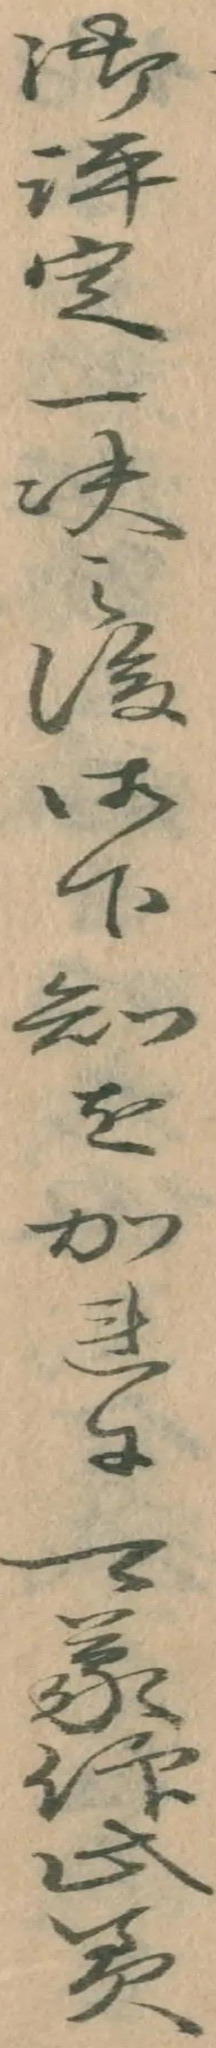御評定一決之後御下知を加連尓可蒙仰此美

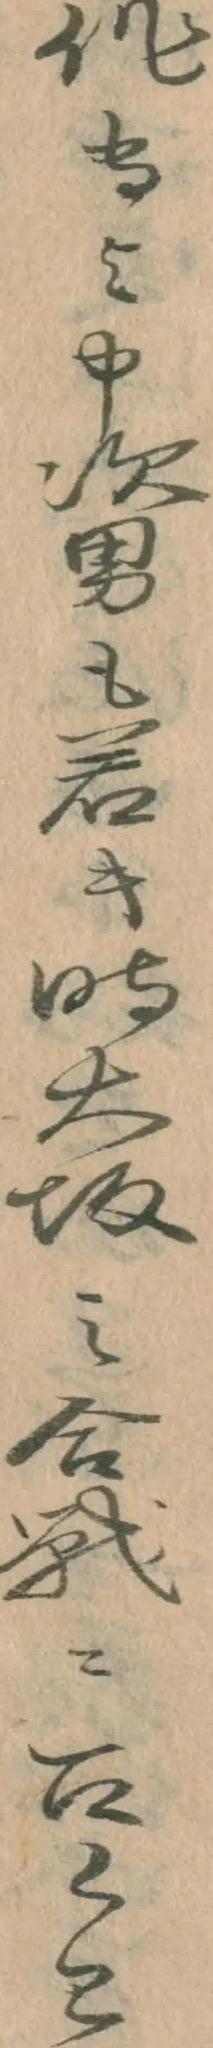作守与申次男も若き時大坂之合戦に召く已
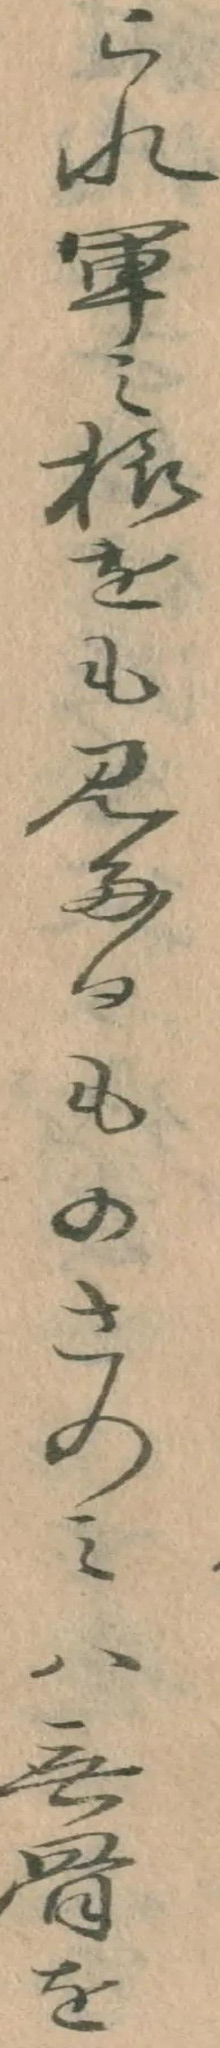られ軍之様をも見多るものさのみは無骨を
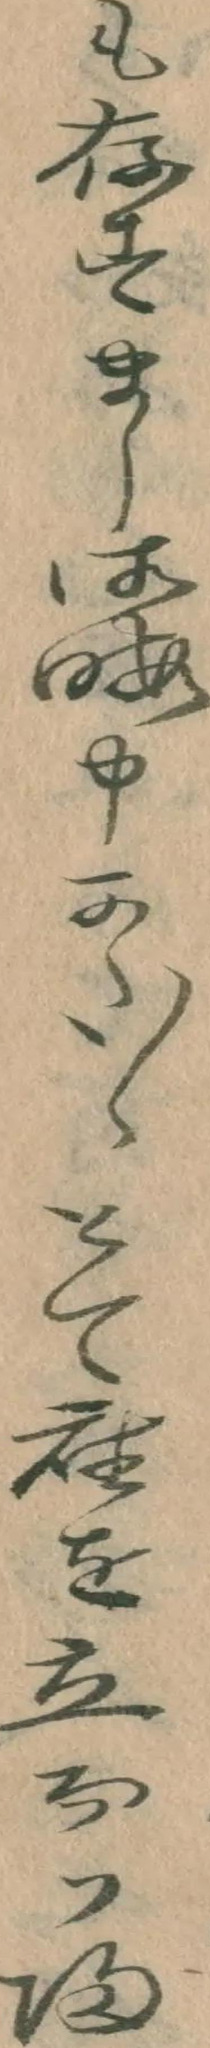も存春まし御暇申かた〱とて座を立而か帰
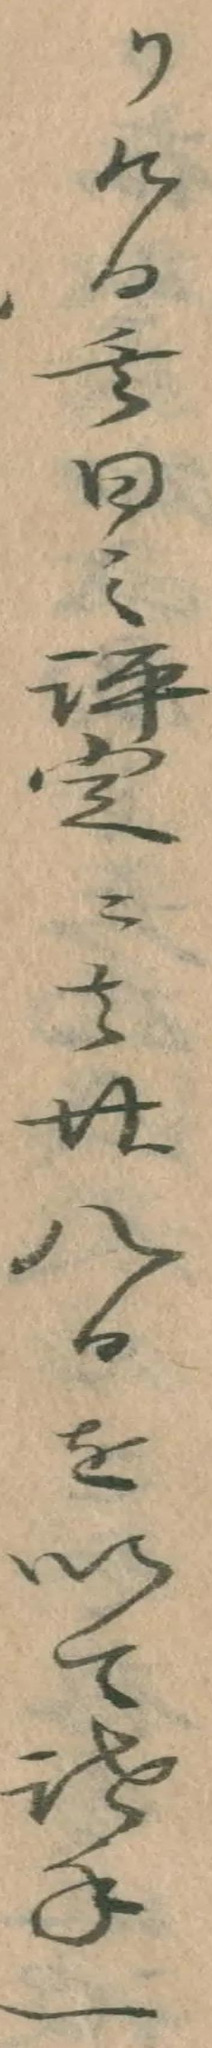りける其日之評定に者廿八日を以て諸手一
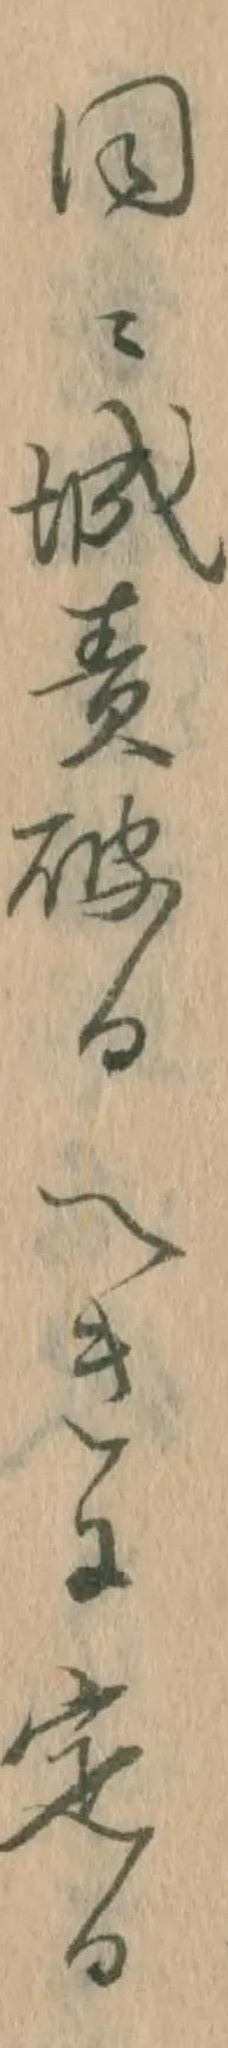同に城責破るへき尓定る
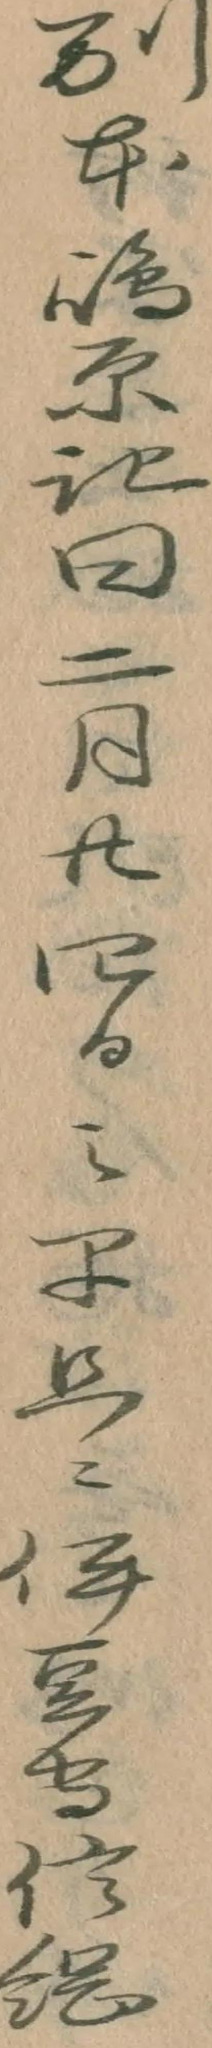別本島原記曰二月廿四日之早旦に伊豆守信綱
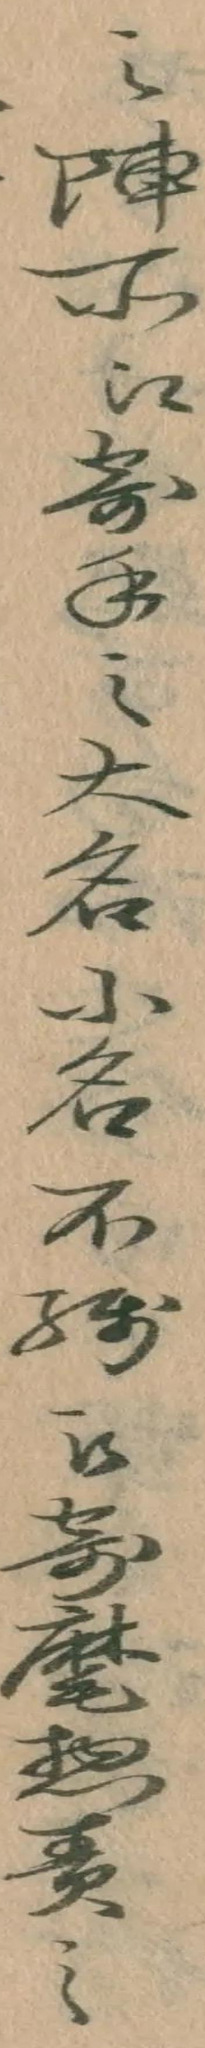之陣所江寄手之大名小名不残被寄魔惣責之
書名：切支丹御退治記 49巻. [7]
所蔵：国立国会図書館 National Diet Library, JAPAN
